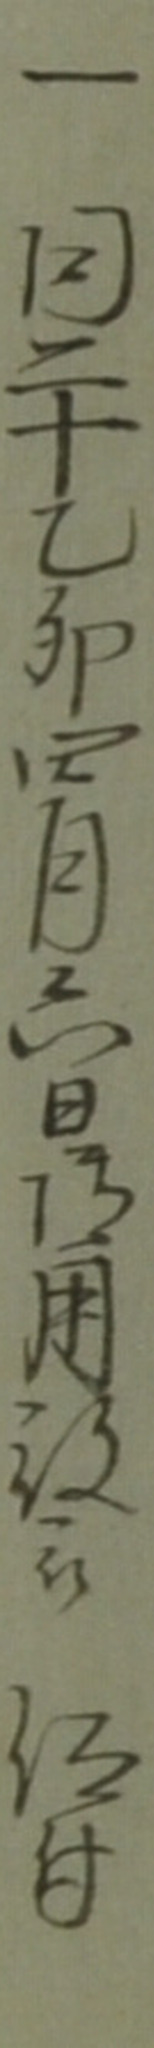一同二十乙卯四月六日御用役被仰付
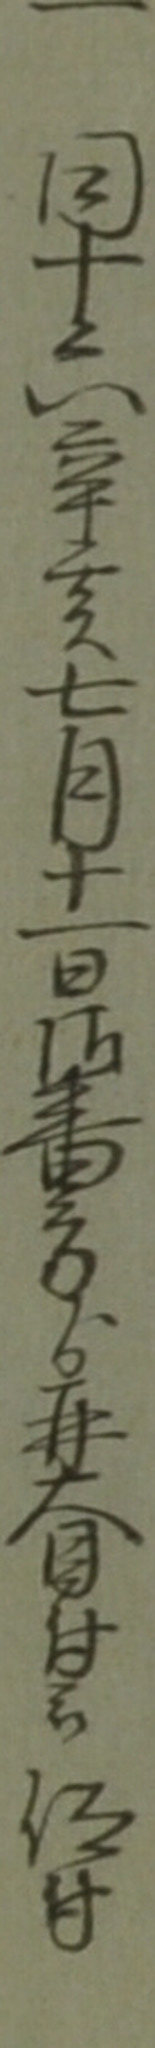一同十六辛亥七月十一日御番方ゟ再大目付被仰付

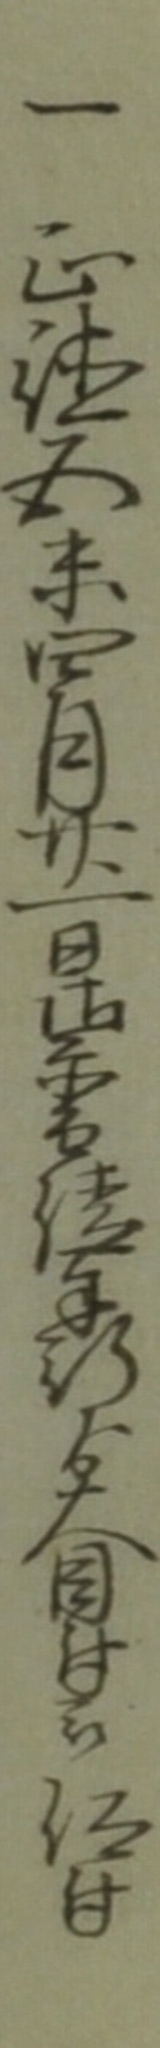一正徳五未四月廿一日御普請奉行ゟ大目付被仰付
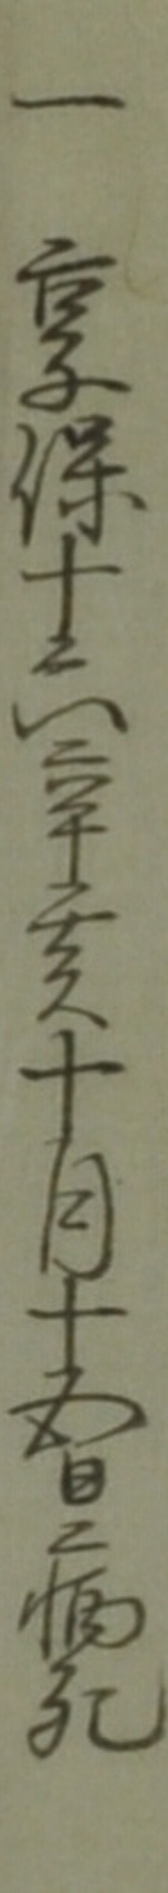一享保十六辛亥十月十五日病死
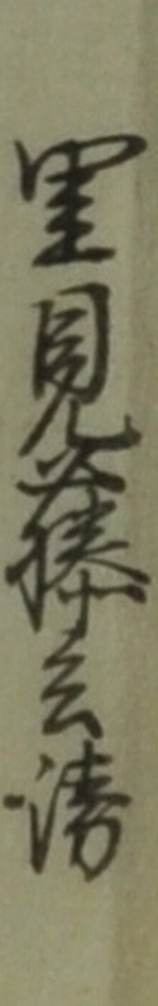里見藤兵衛
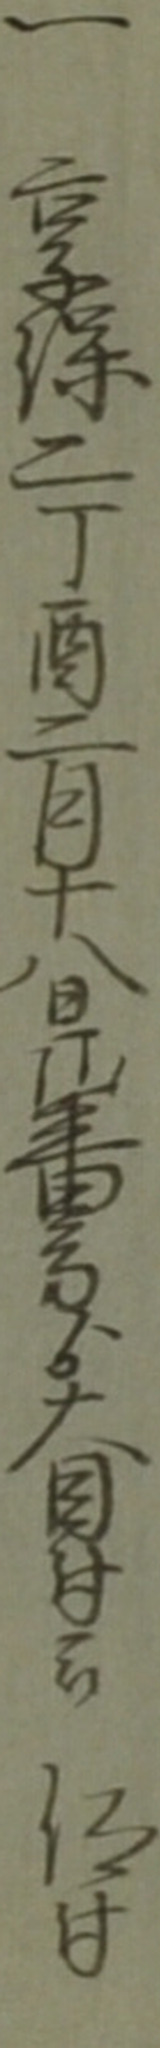一享保二丁酉二月十八日御番方ゟ大目付被仰付
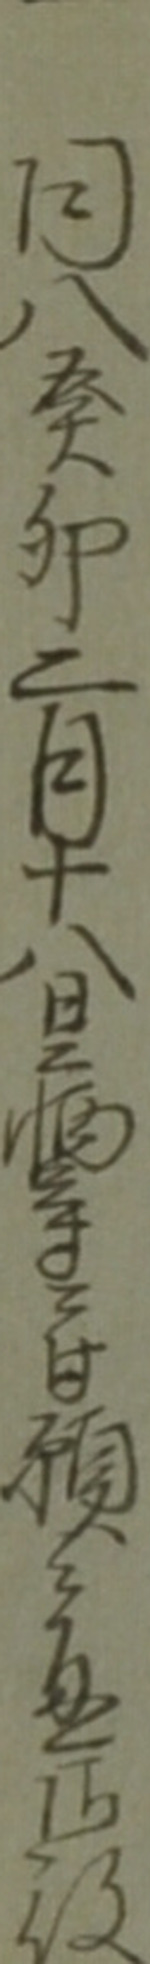一同八癸卯二月十八日病気ニ付願之通御役
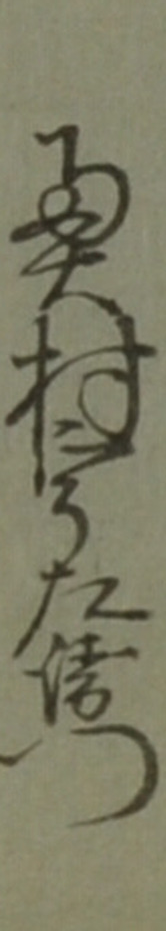奥村宇左衛門
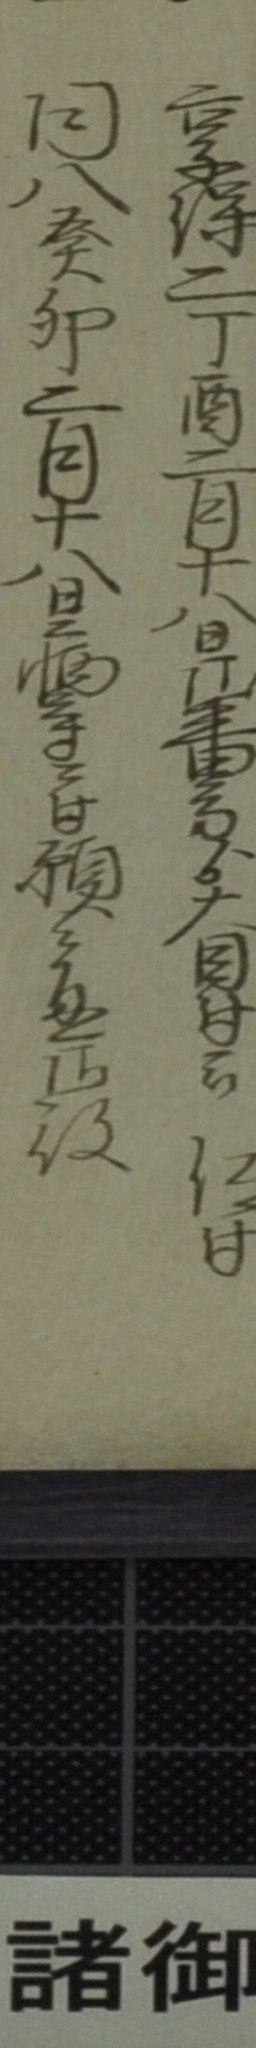一同八癸卯二月十八日病気ニ付願之通御役
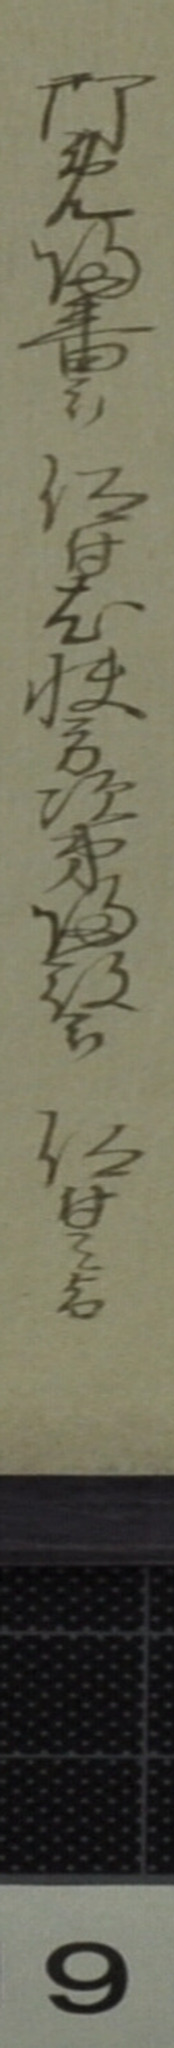御免帰番被仰付尤快方次第帰役被仰付之旨
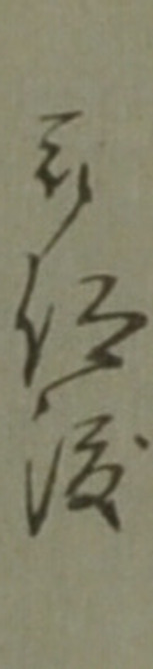被仰渡
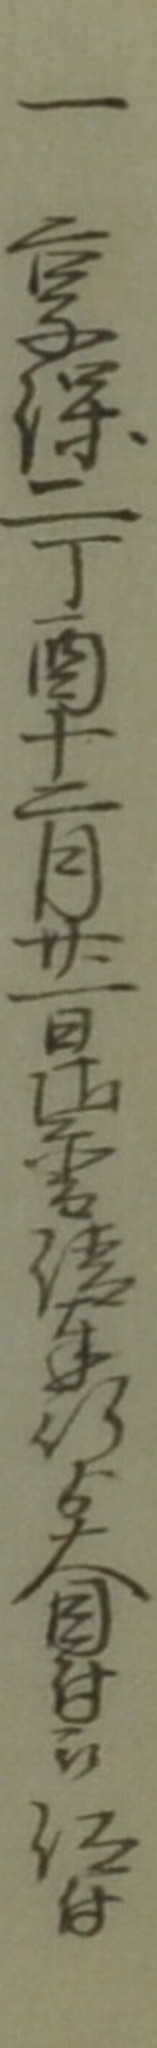一享保二丁酉十二月廿一日御普請奉行ゟ大目付被仰付
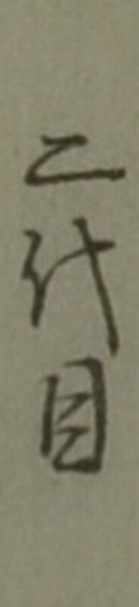二代目
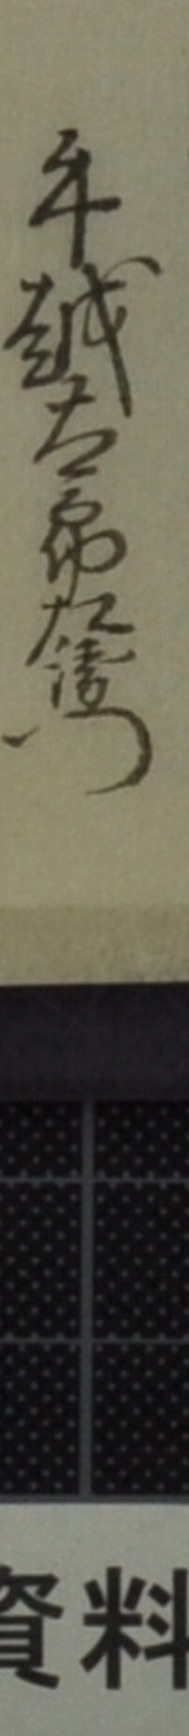牛越太郎左衛門
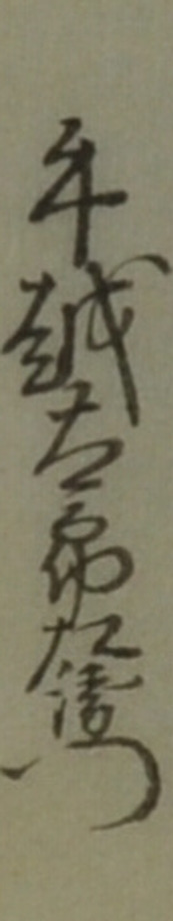牛越太郎左衛門
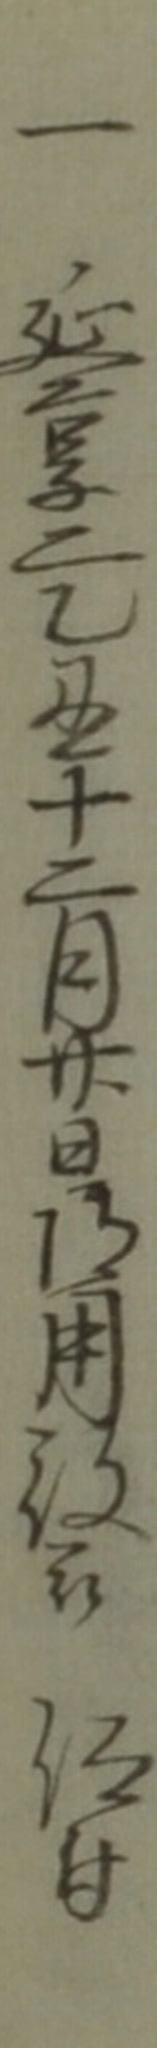一延享二乙丑十二月廿日御用役被仰付
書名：諸御役代々録（三）
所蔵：伊那市立高遠町図書館・合同会社AMANE
